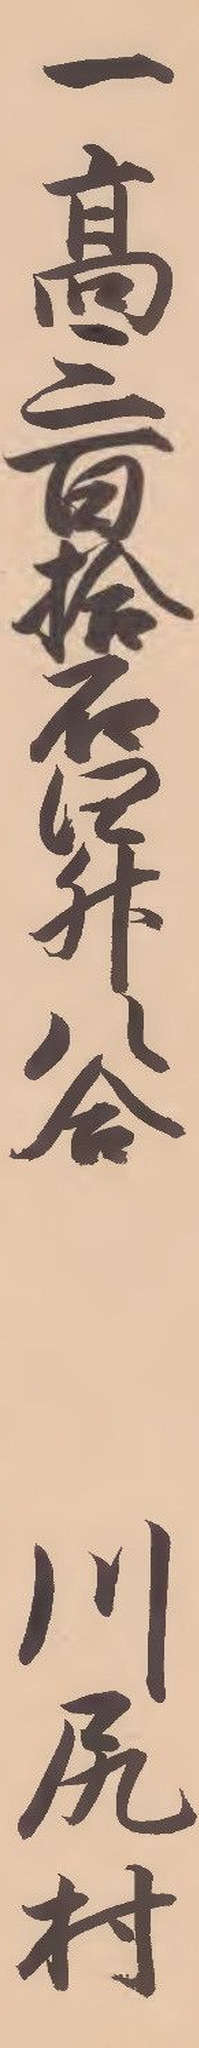一高三百拾石四升八合川尻村
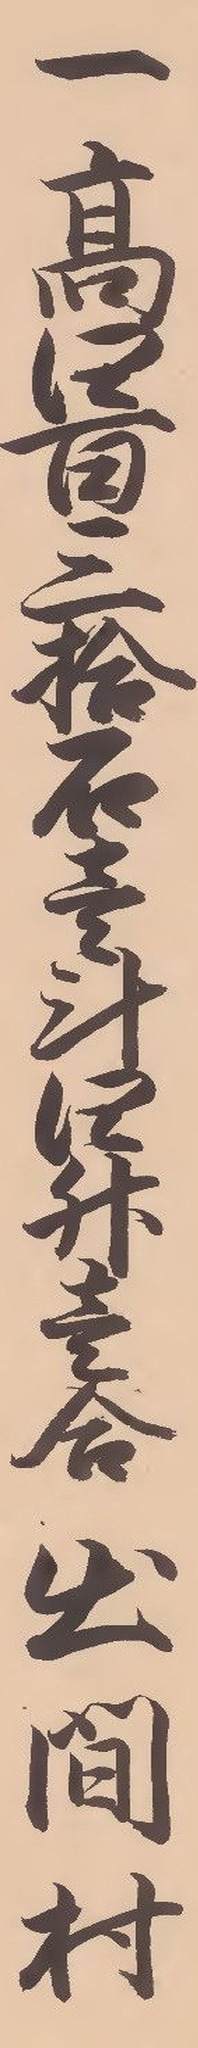一高四百三拾石壱斗四升壱合出間村
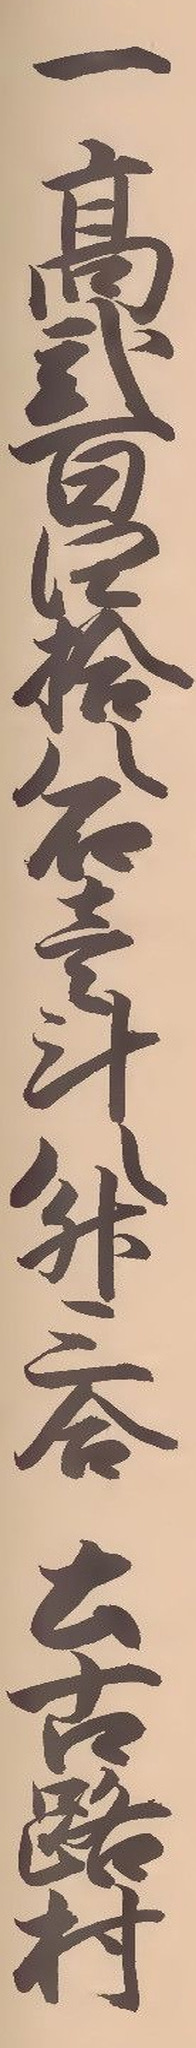一高弐百四拾八石壱斗八升三合土古路村
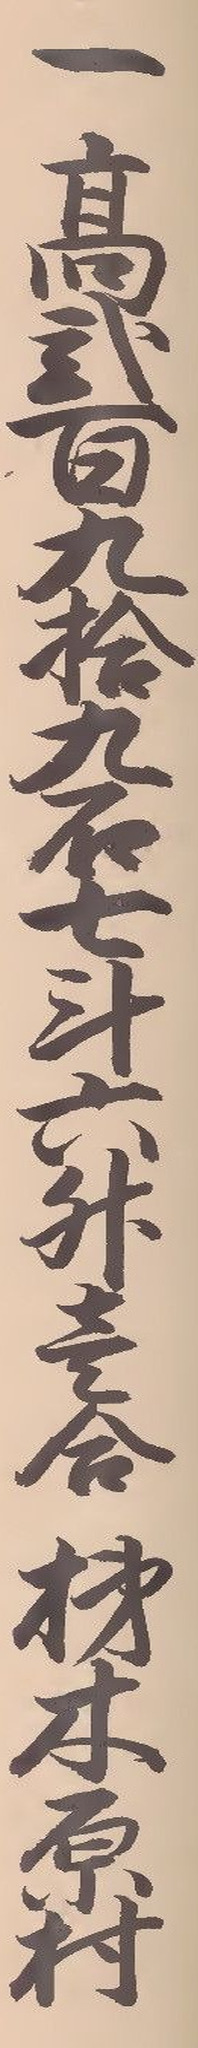一高弐百九拾九石七斗六升壱合柿木原村
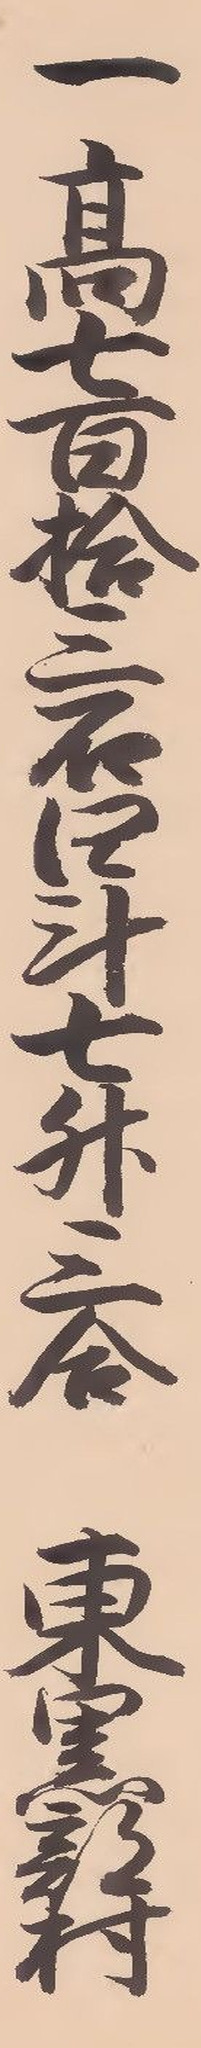一高七百拾三石四斗七升三合東黒部村
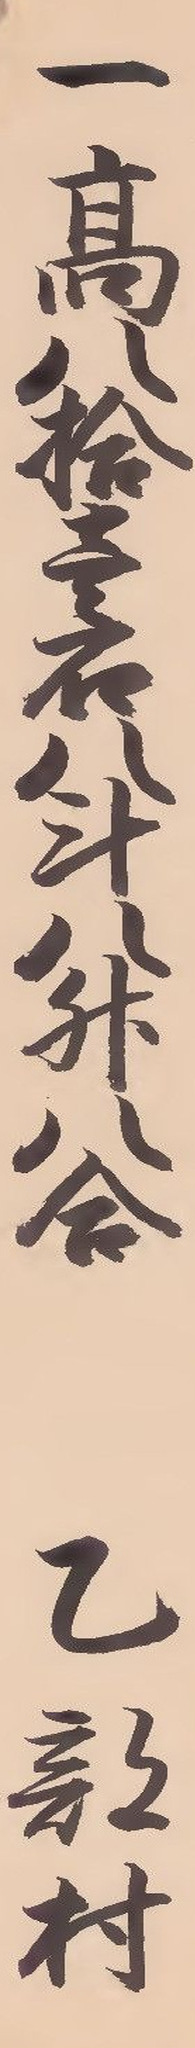一高八拾壱石八斗八升八合乙部村
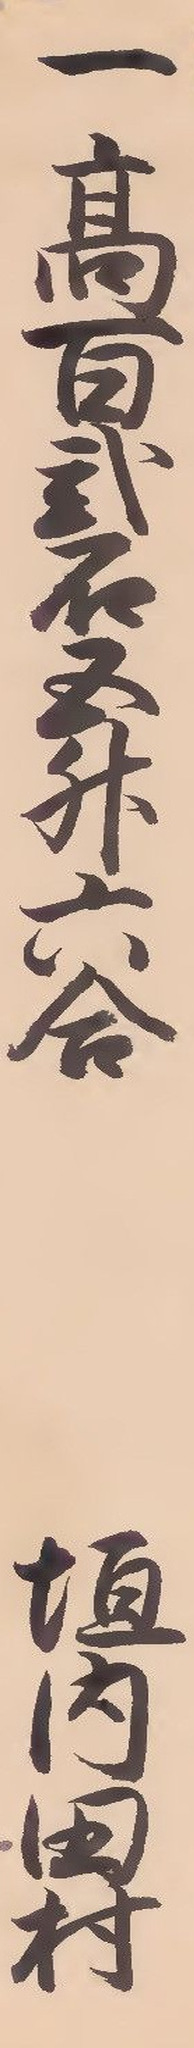一高百弐石五升六合垣内田村

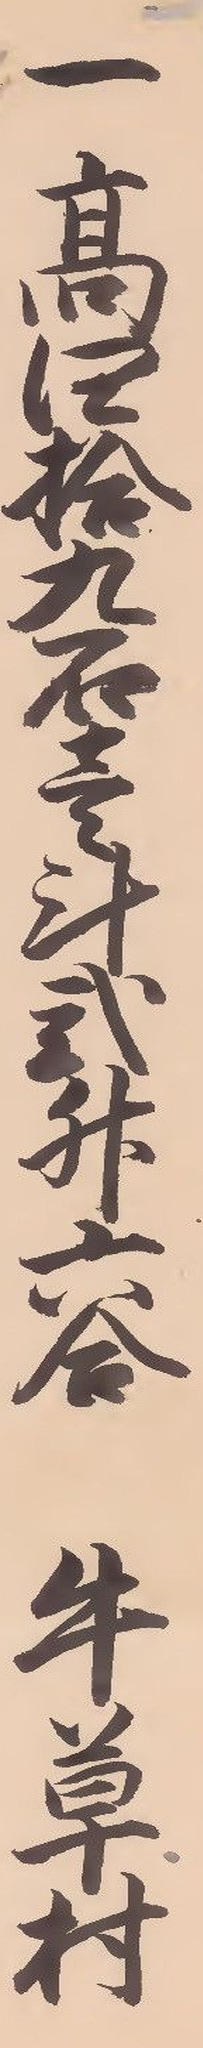一高四拾九石壱斗弐升六合牛草村
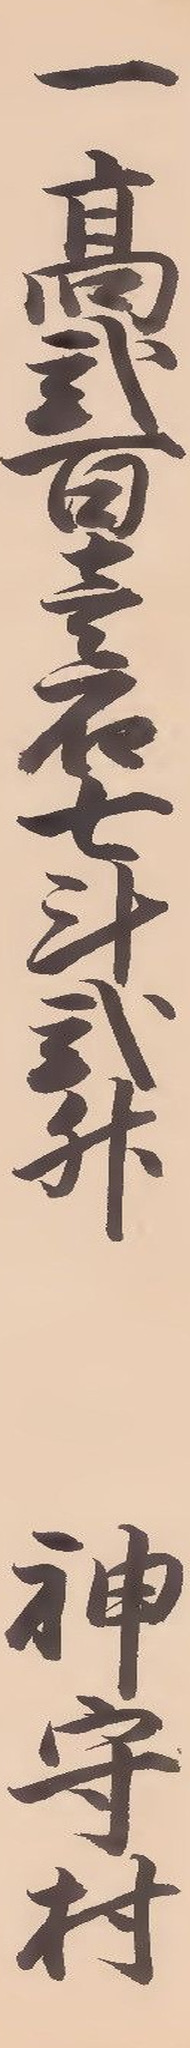一高弐百壱石七斗弐升神守村
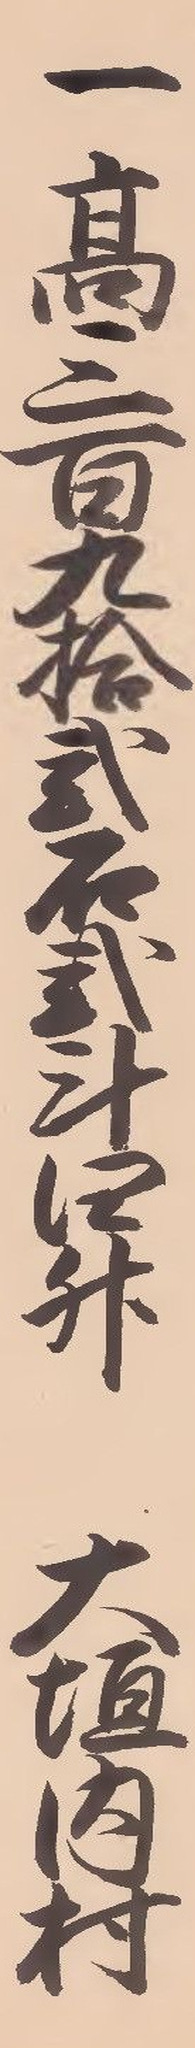一高三百九拾弐石弐斗四升大垣内村
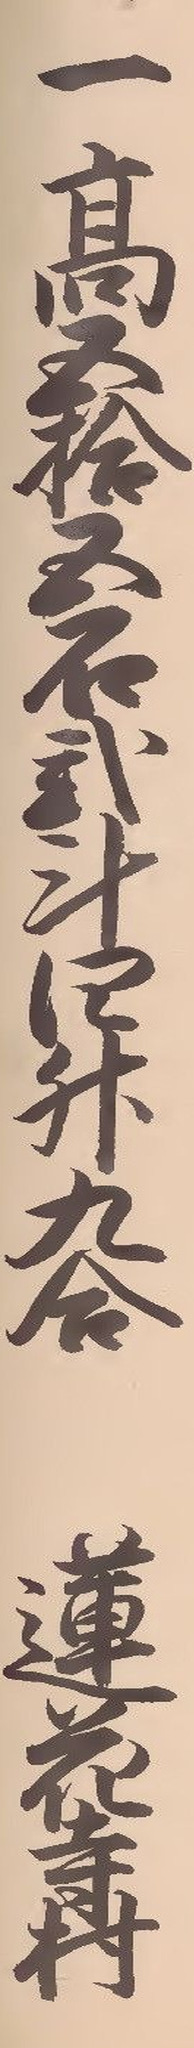一高五拾五石弐斗四升九合蓮花寺村
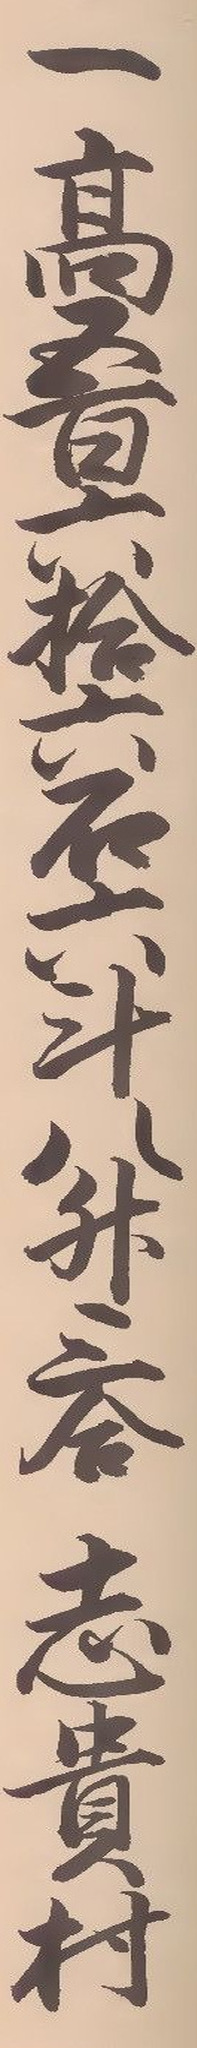一高五百六拾六石六斗八升三合志貴村
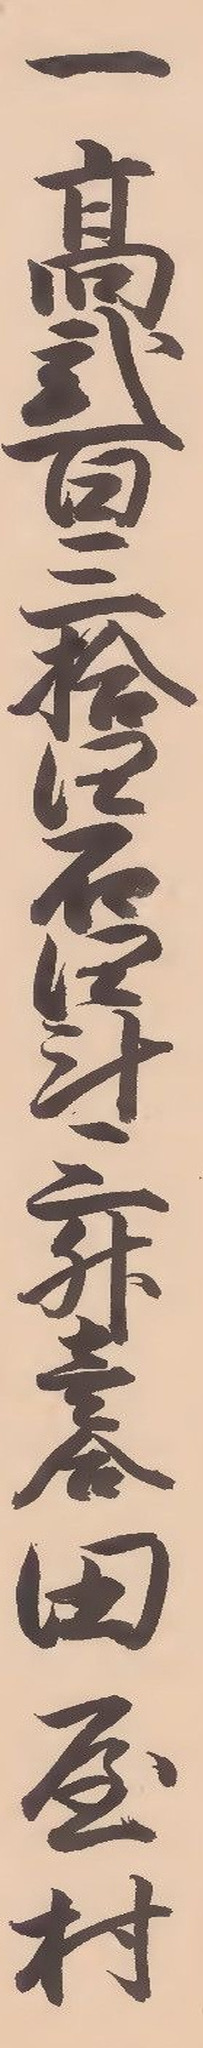一高弐百三拾四石四斗三升壱合田屋村
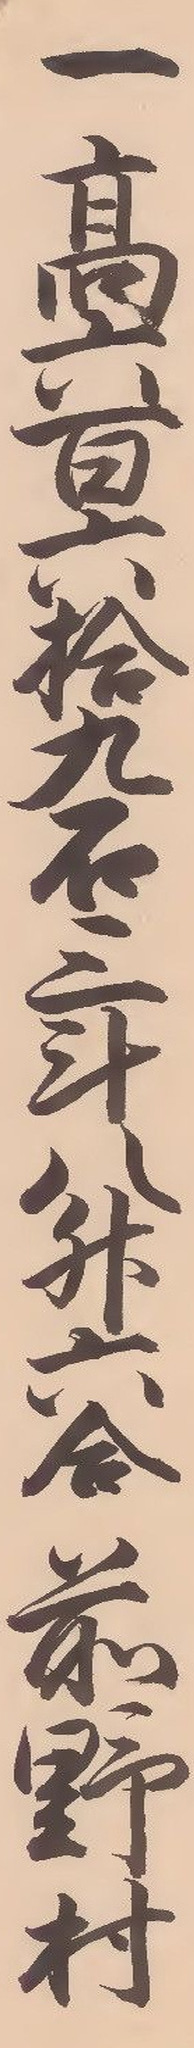一高六百六拾九石三斗八升六合前野村
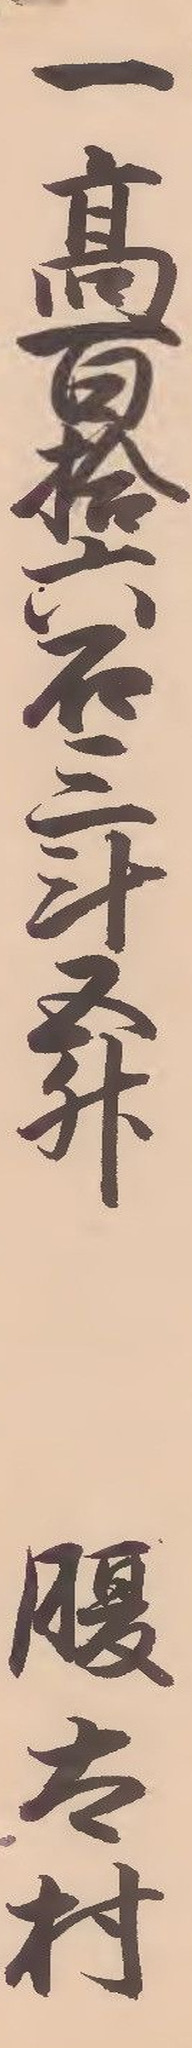一高百拾六石三斗五升腹太村

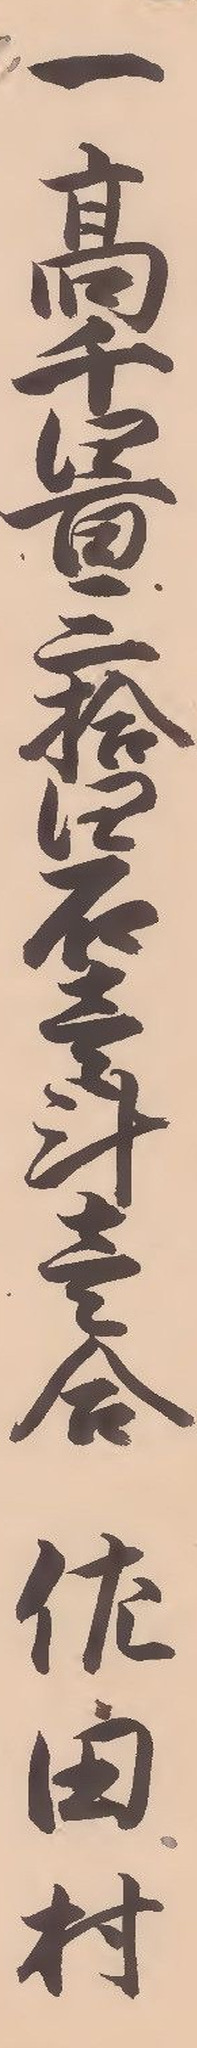一高千四百三拾四石壱斗壱合佐田村
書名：伊勢国郷帳
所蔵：国立公文書館 National Archives of Japan
